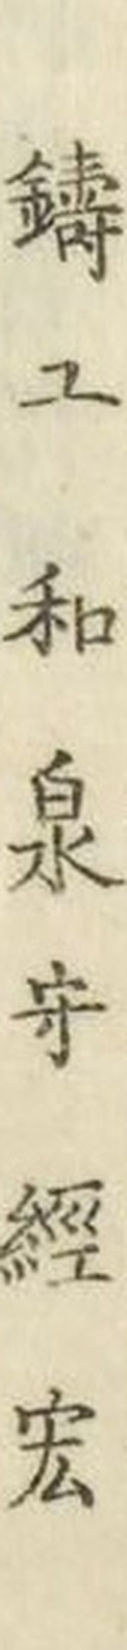鋳工和泉守経宏
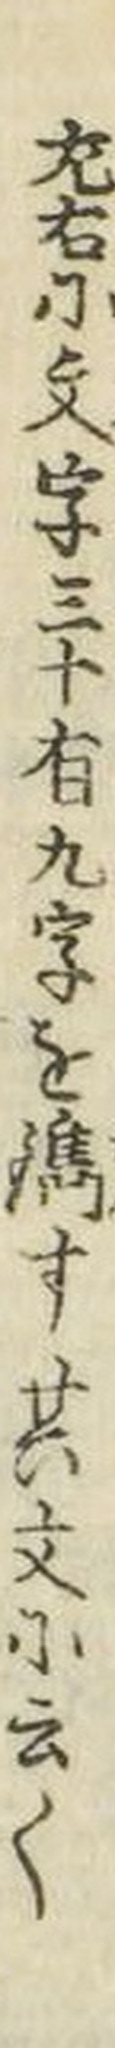左右に文字三十有九字を鐫す其文に云く
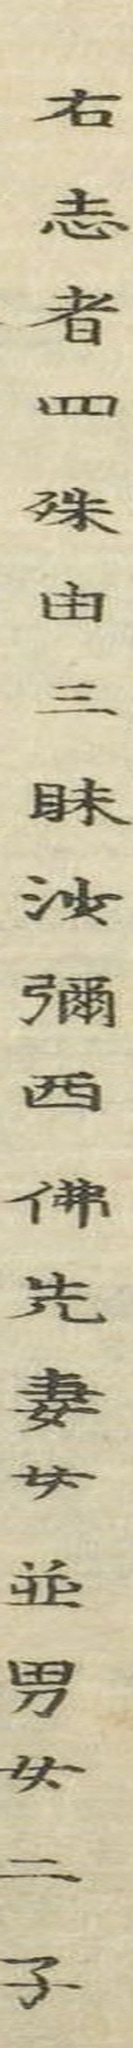右志者四殊由三昧沙弥西仏先妻女並男女二子
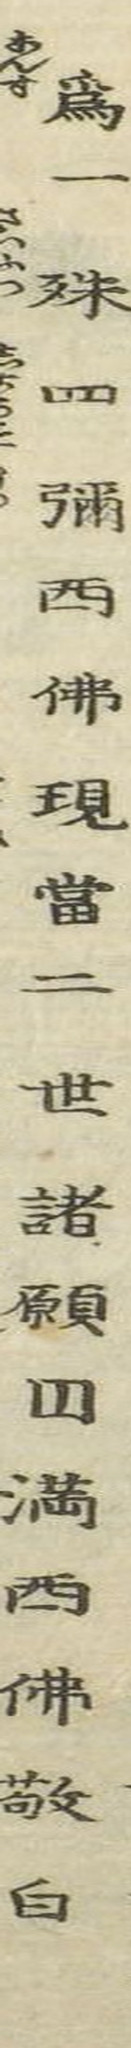為一殊四弥西仏現当二世諸願円満西仏敬白
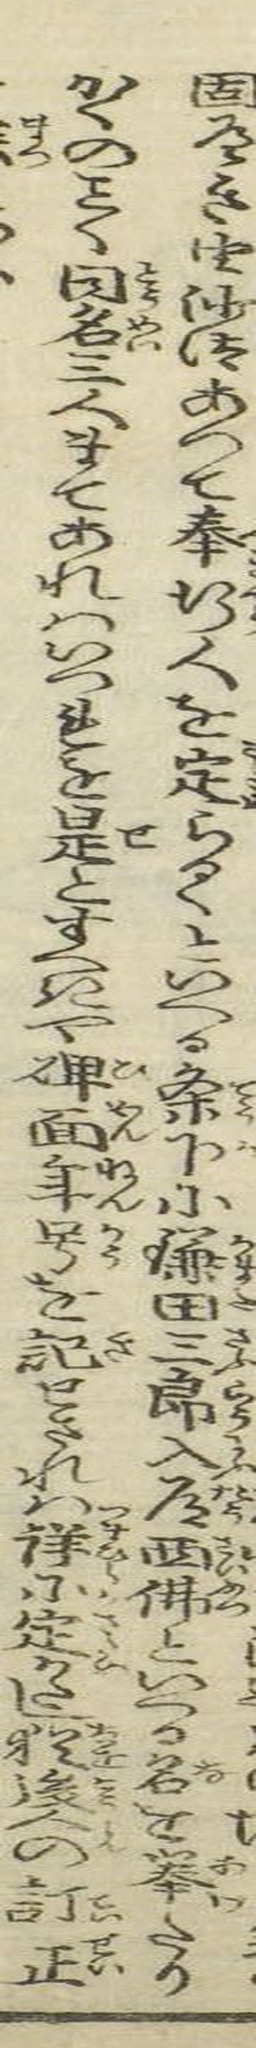かくのことく同名三人まてあれはいつれを是とすへきや碑面年号を記せされは詳に定かたし猶後人の訂正を竢といふ
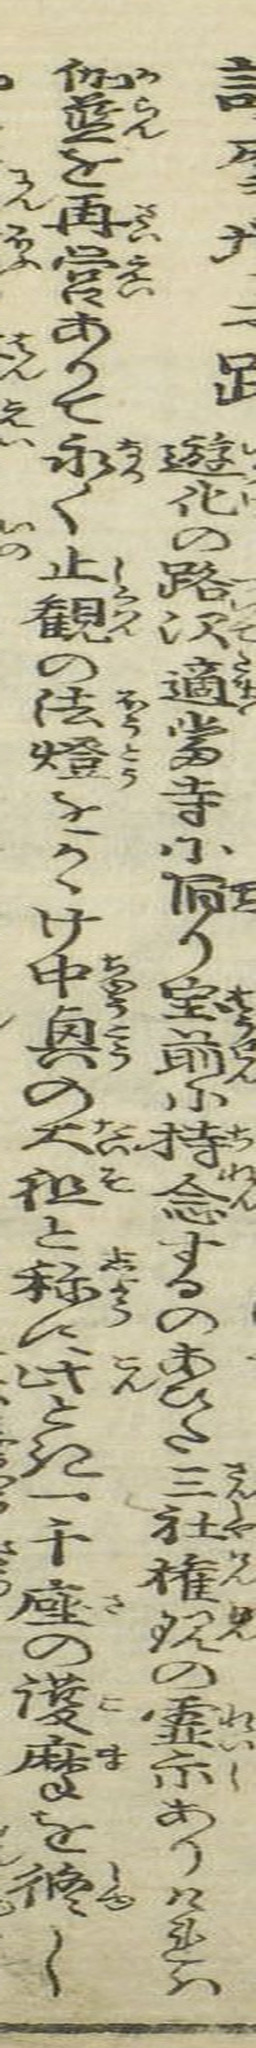伽藍を再営ありて永く止観の法灯をかゝけ中興の大祖と称す此とき一千座の護摩を修し

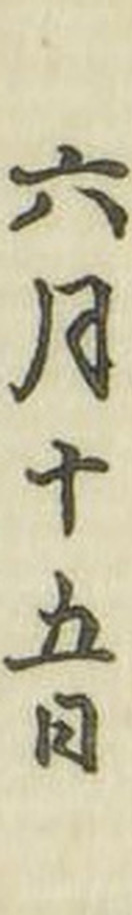六月十五日

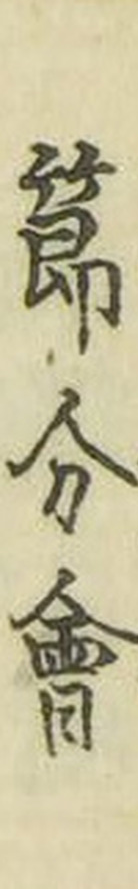節分会

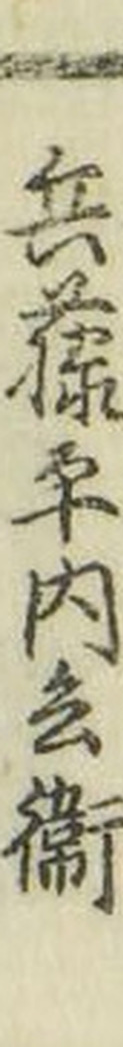兵藤平内兵衛
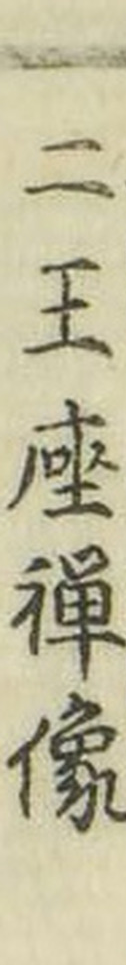二王座禅像

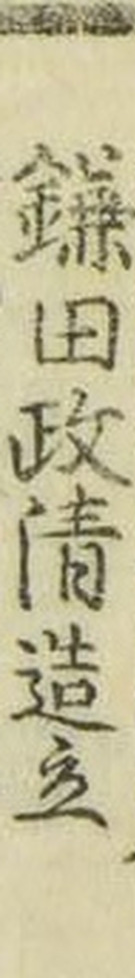鎌田政清造立
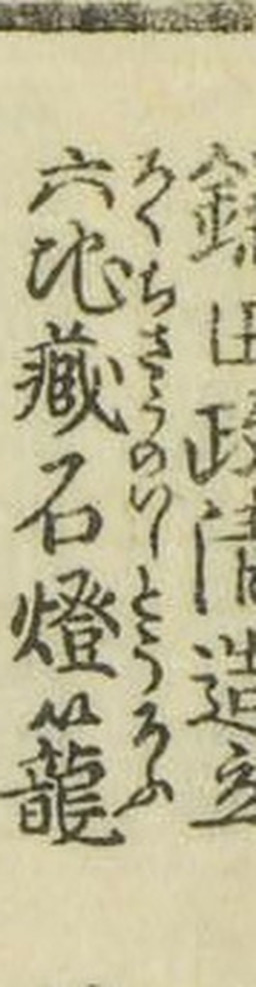六地蔵石灯籠
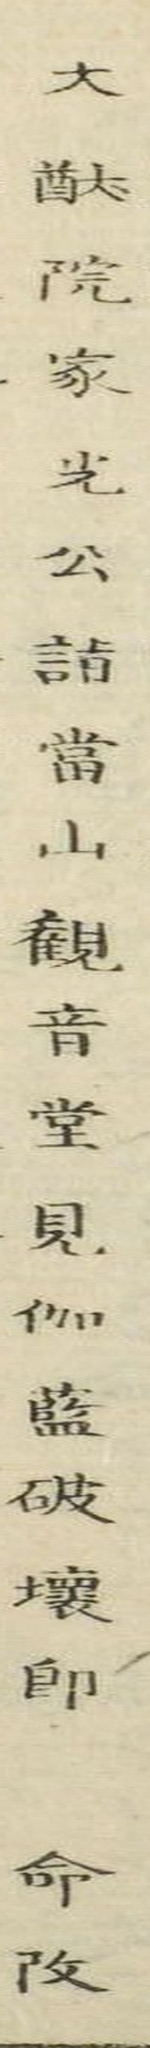大猷院家光公詣当山観音堂見伽藍破壊即命改
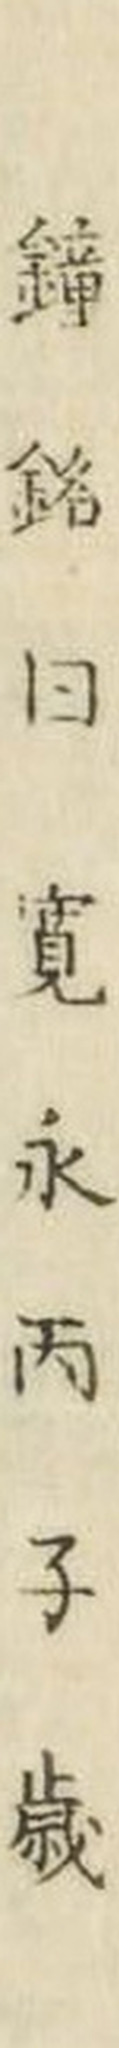鐘銘曰寛永丙子歳
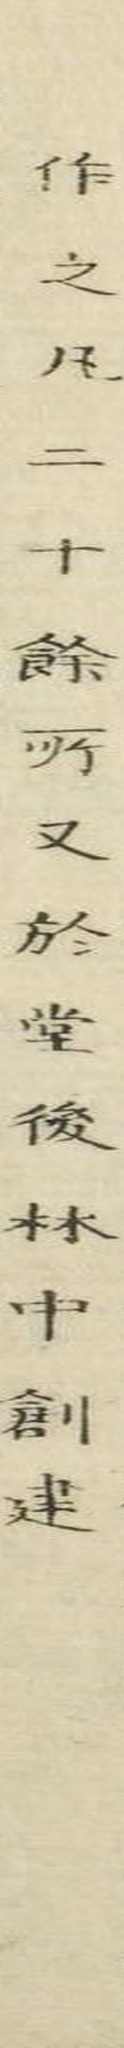作之凡二十余所又於堂後林中創建
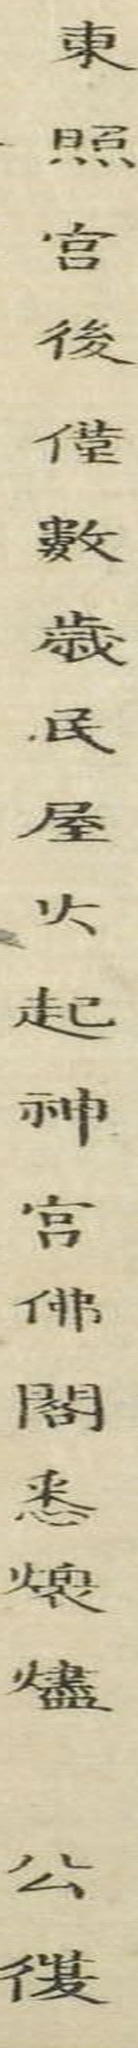東照宮後僅数歳民屋火起神宮仏閣悉燠燼公復
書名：江戸名所図会 20巻 巻之16
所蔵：東京学芸大学教育コンテンツアーカイブ
